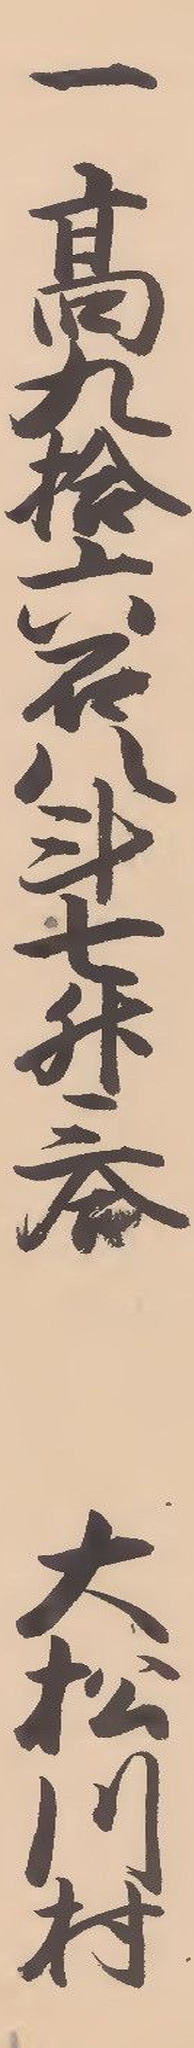一高九拾六石八斗七升三合大松川村
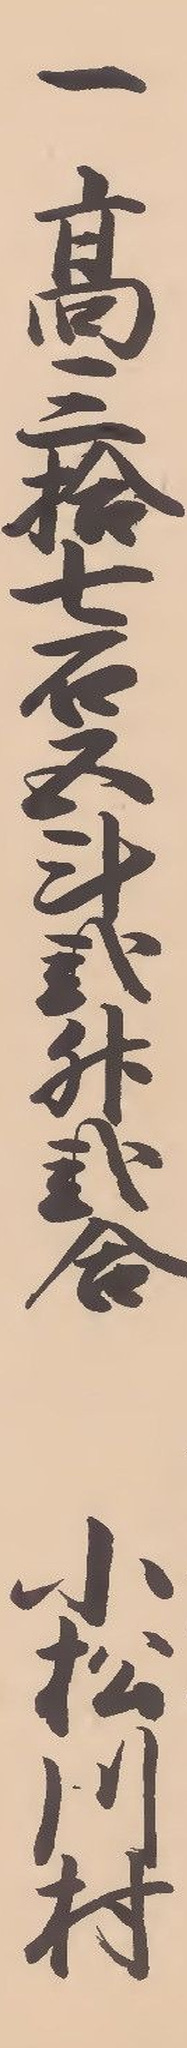一高三拾七石五斗弐升弐合小松川村
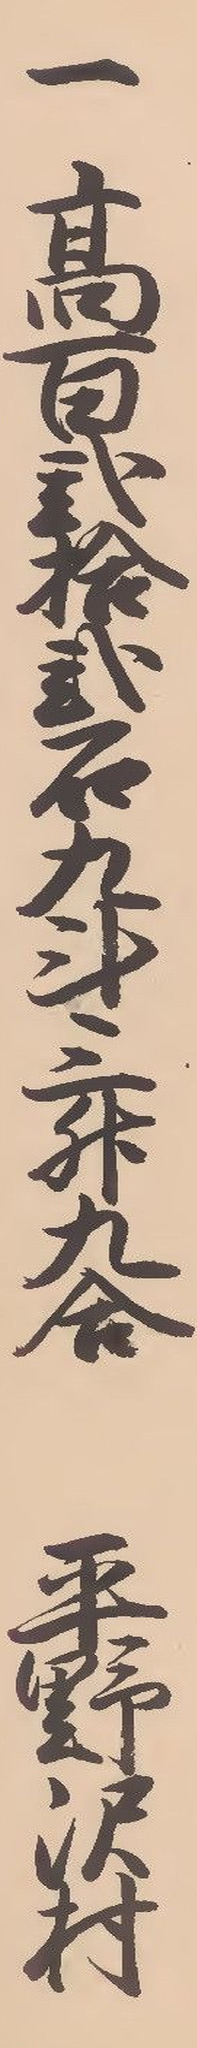一高百弐拾弐石九斗三升九合平野沢村
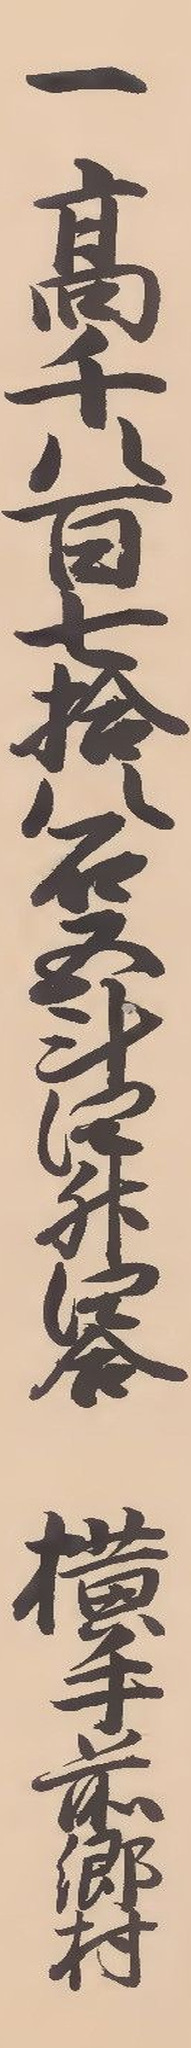一高千八百七拾八石五斗四升四合横手前郷村
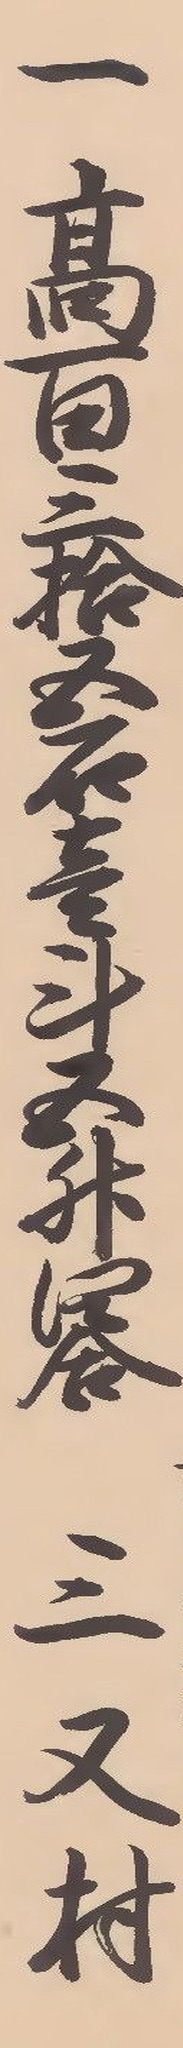一高百三拾五石壱斗五升四合三又村
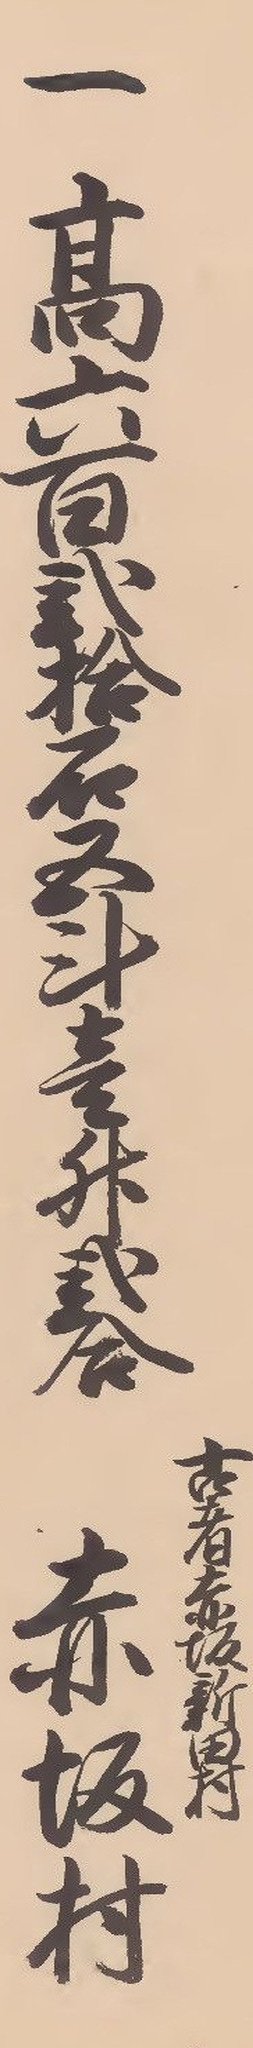一高六百弐拾石五斗壱升弐合赤坂村
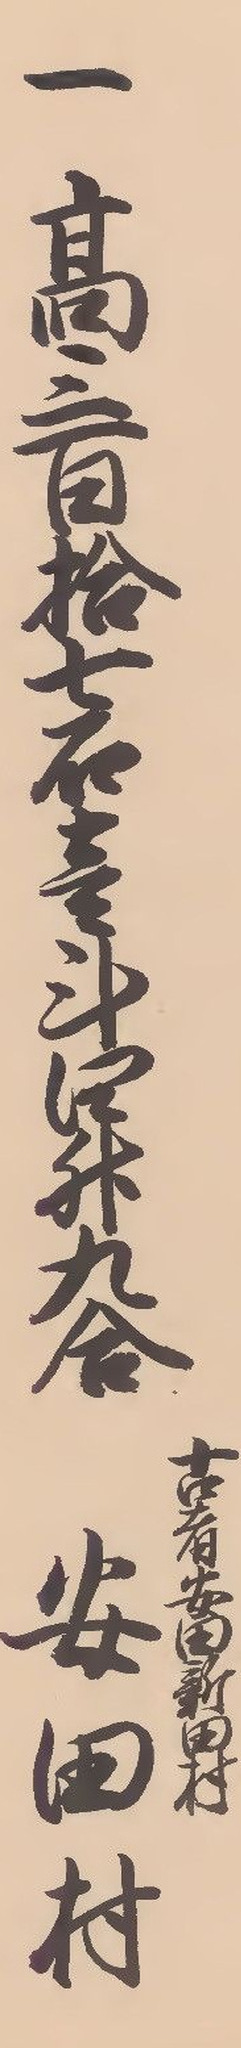一高三百拾七石壱斗四升九合安田村

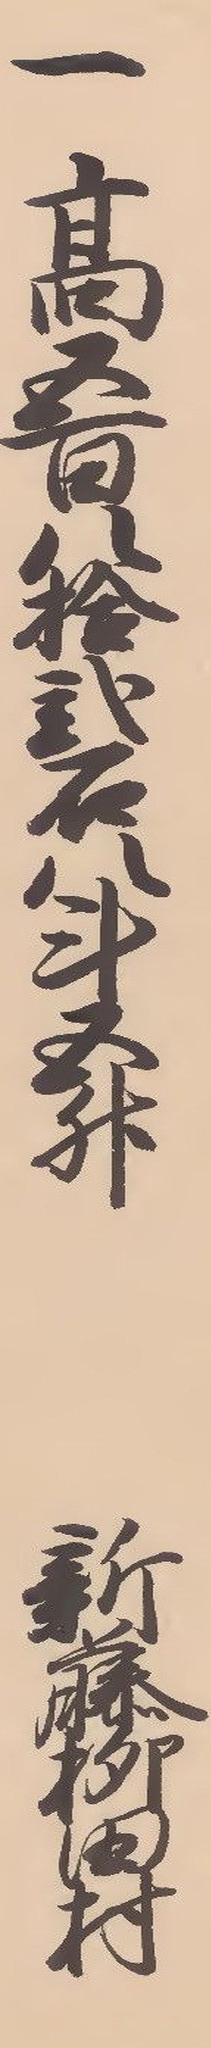一高五百八拾弐石八斗五升新藤柳田村
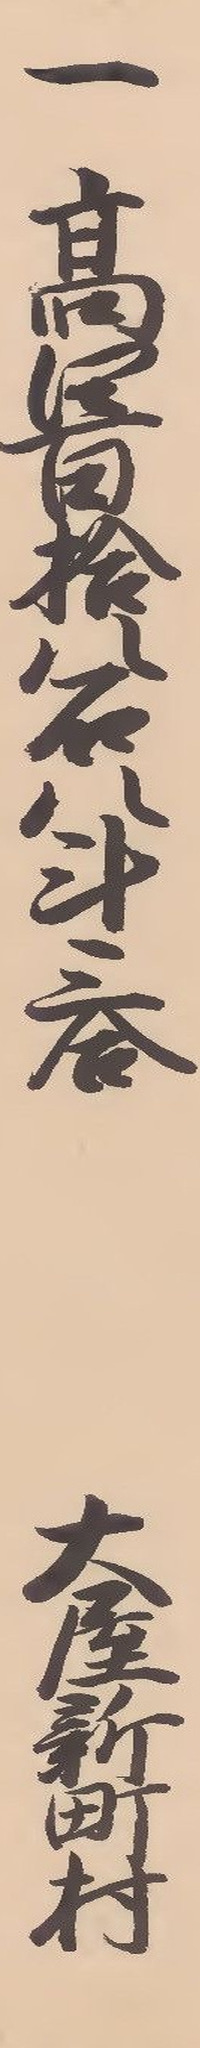一高四百拾八石八斗三合大屋新町村
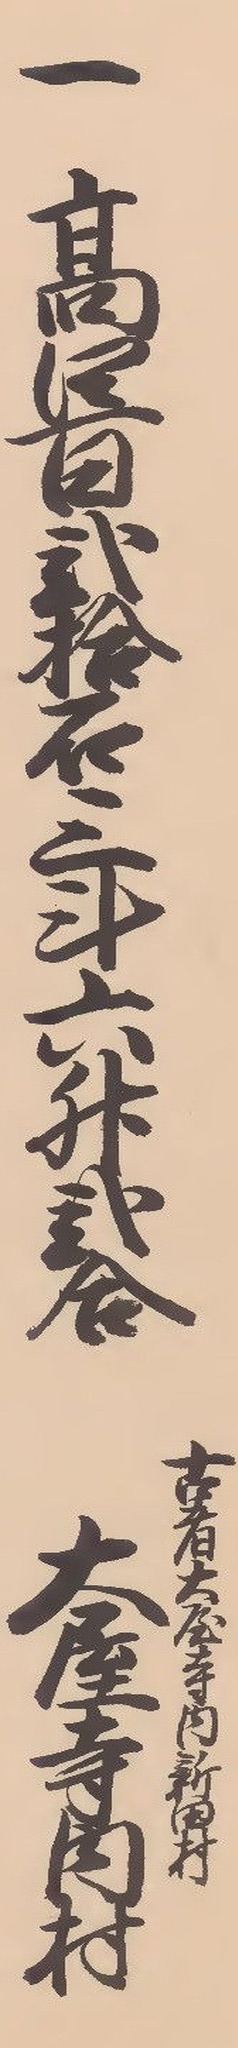一高四百弐拾石三斗六升弐合大屋寺内村
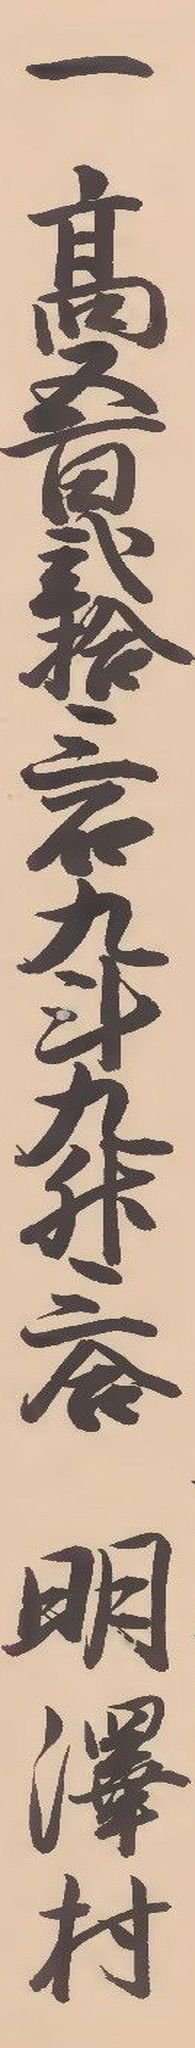一高五百弐拾三石九斗九升三合明沢村
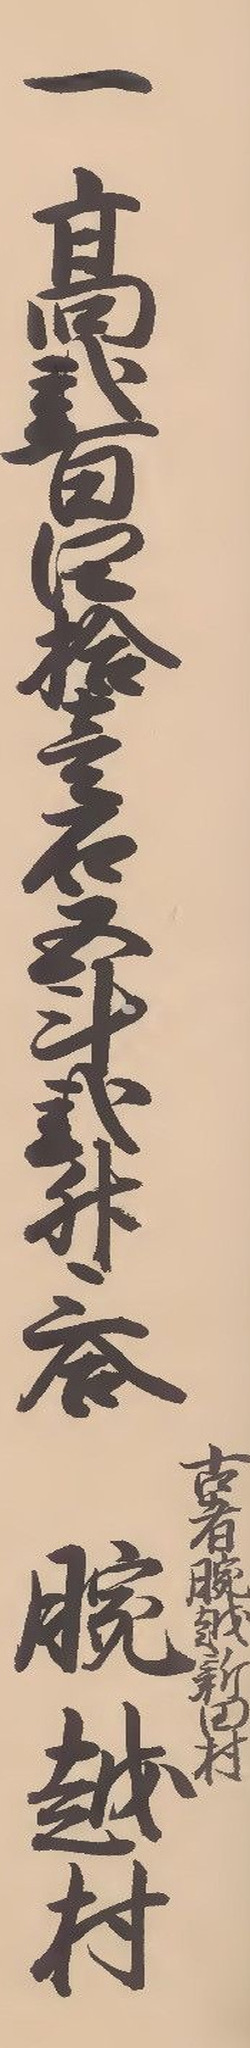一高弐百四拾壱石五斗弐升三合腕越村
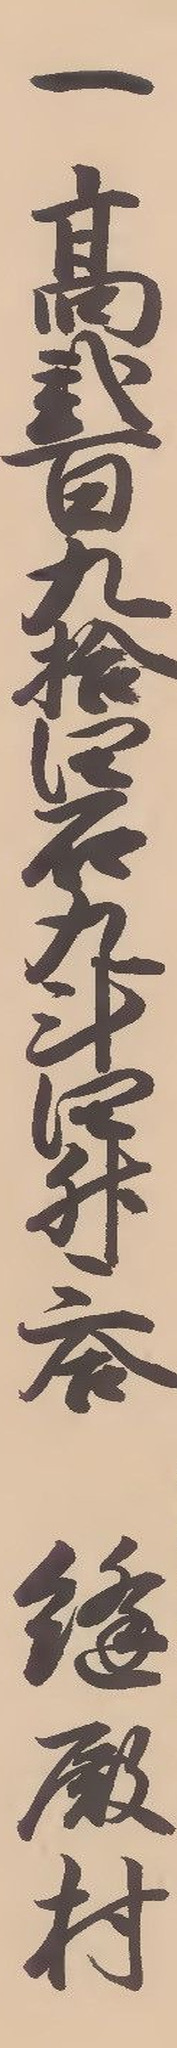一高弐百九拾四石九斗四升三合縫殿村
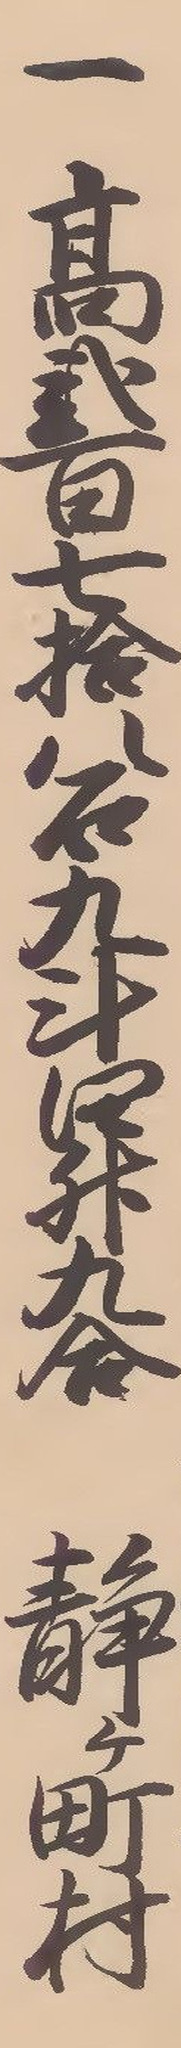一高弐百七拾八石九斗四升九合静ヶ町村

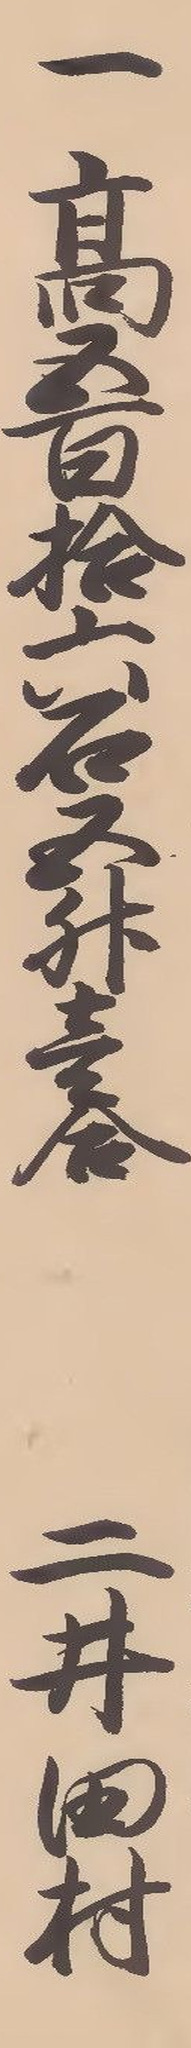一高五百拾六石五升壱合二井田村
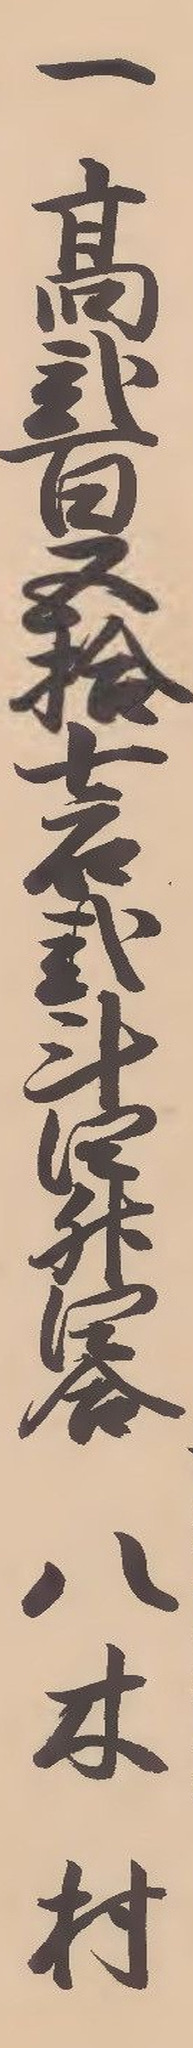一高弐百五拾七石弐斗四升四合八木村
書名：出羽国郷帳　５
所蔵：国立公文書館 National Archives of Japan
